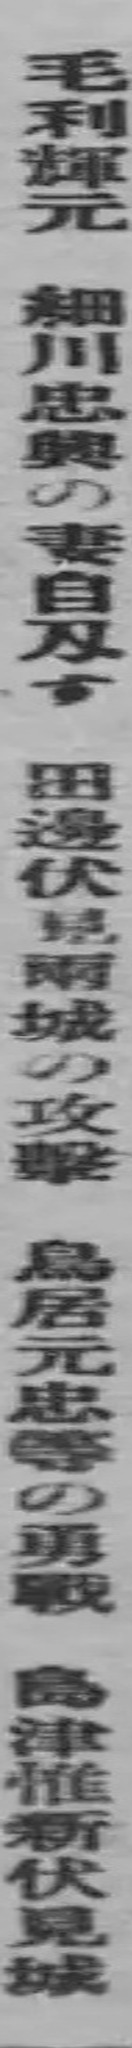毛利輝元細川忠興の妻自刃す田辺伏見両城の攻撃鳥居元忠等の勇戦島津惟新伏見城
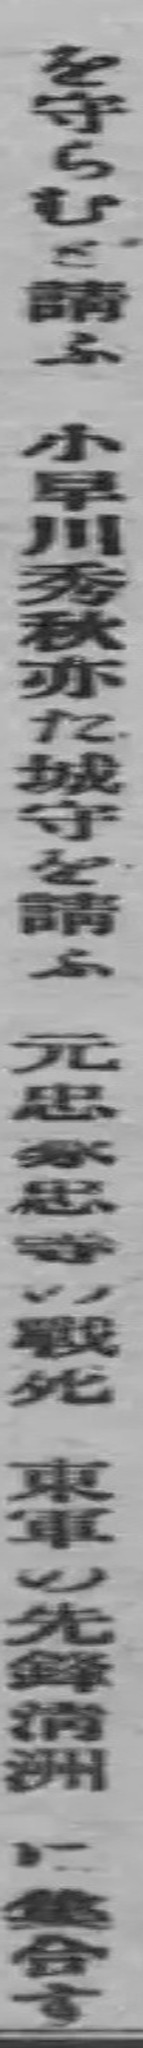を守らむと請ふ小早川秀秋亦た城守を請ふ元忠家忠等の戦死東軍の先鋒清洲城に集合す
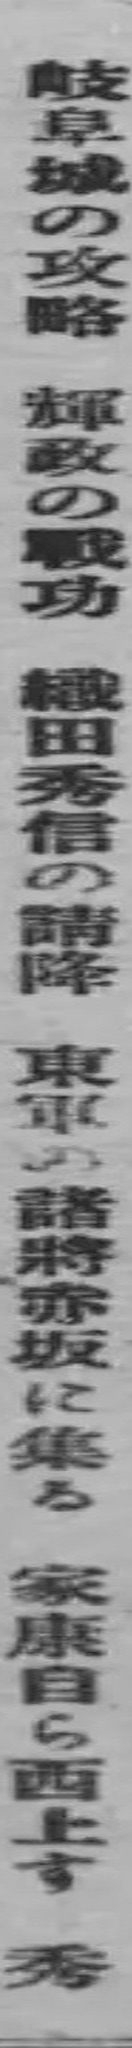岐阜城の攻略輝政の戦功織田秀信の請降東軍の諸将赤坂に集る家康自ら西上す秀
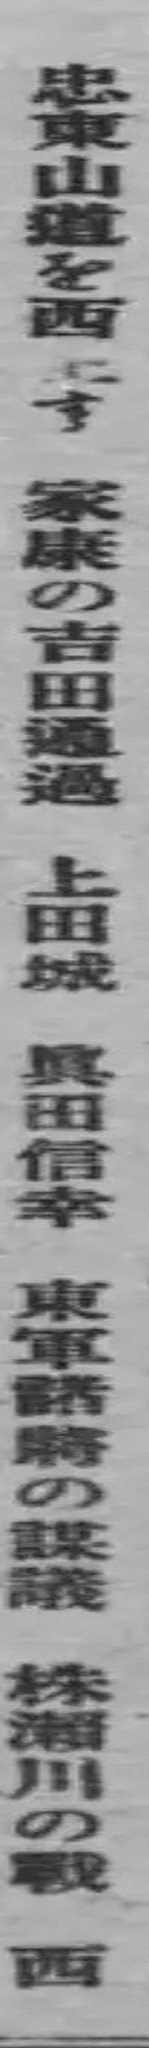忠東山道を西上す家康の吉田通過上田城真田信幸東軍諸将の謀議株瀬川の戦西
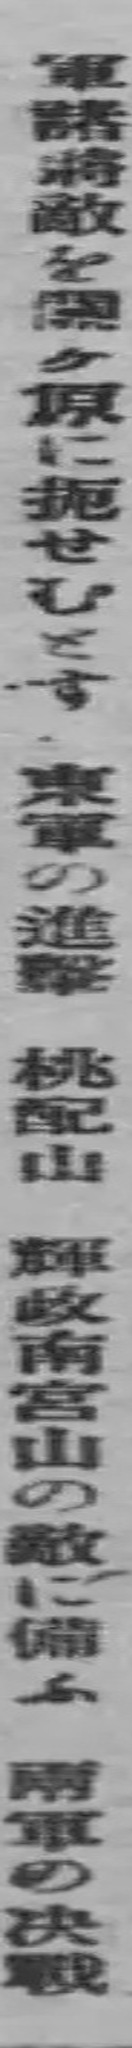軍諸将敵を関ケ原に扼せむとす東軍の進撃桃配山輝政南宮山の敵に備ふ両軍の決戦
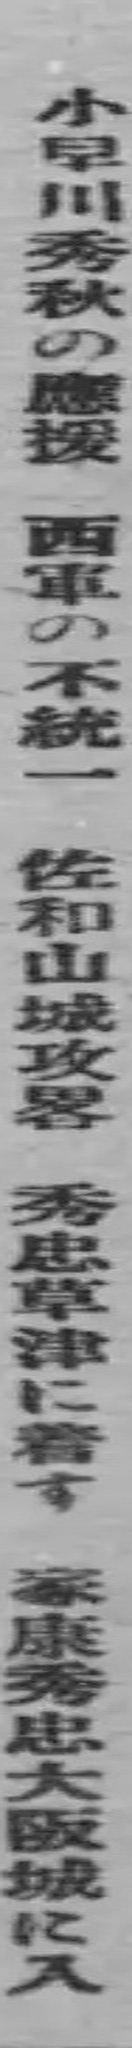小早川秀秋の応援西軍の不統一佐和山城攻略秀忠草津に着す家康秀忠大阪城に入
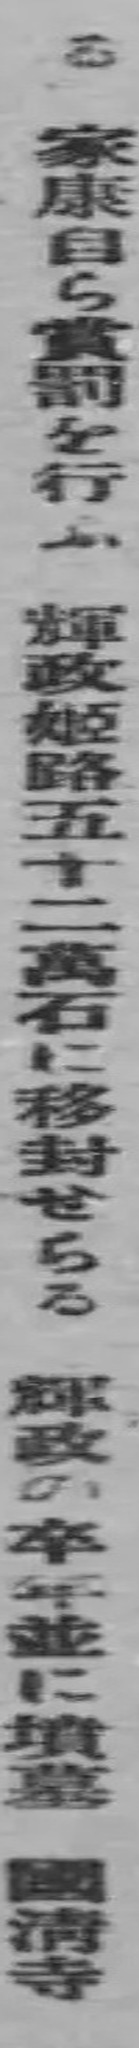る家康自ら賞罰を行ふ輝政姫路五十二万石に移封せらる輝政の卒年並に墳墓国清寺
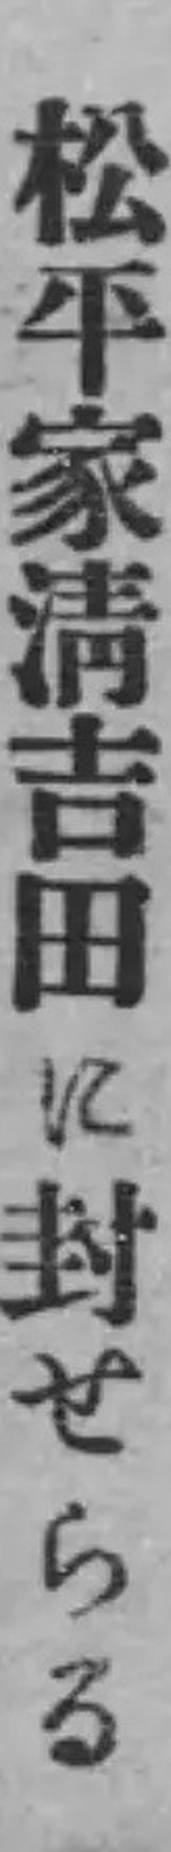松平家清吉田に封せらる
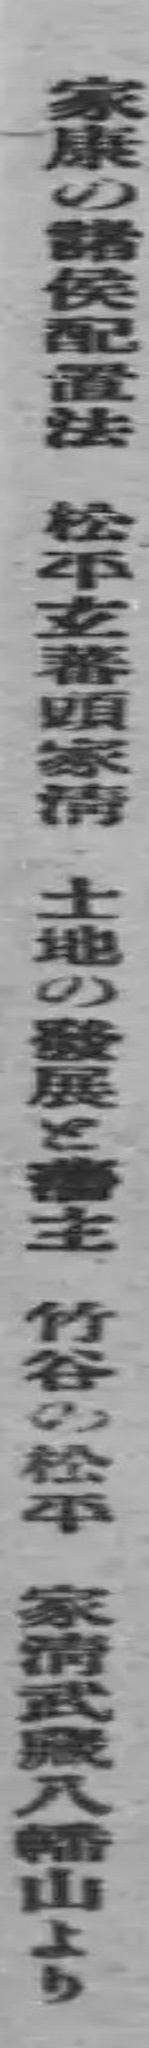家康の諸侯配置法松平玄蕃頭家清土地の発展と藩主竹谷の松平家清武蔵八幡山より
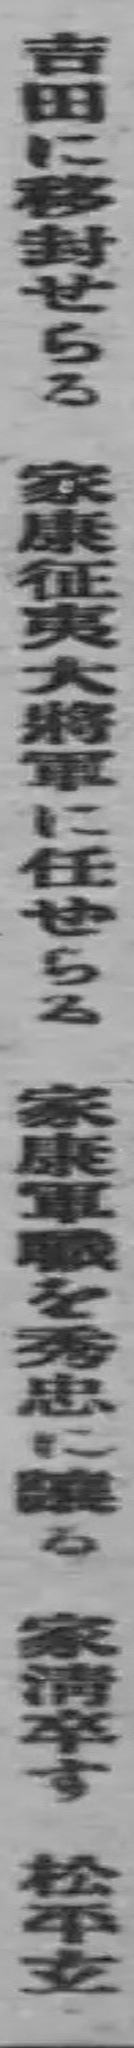吉田に移封せらる家康征夷大将軍に任ぜらる家康軍職を秀忠に譲る家清卒す松平玄
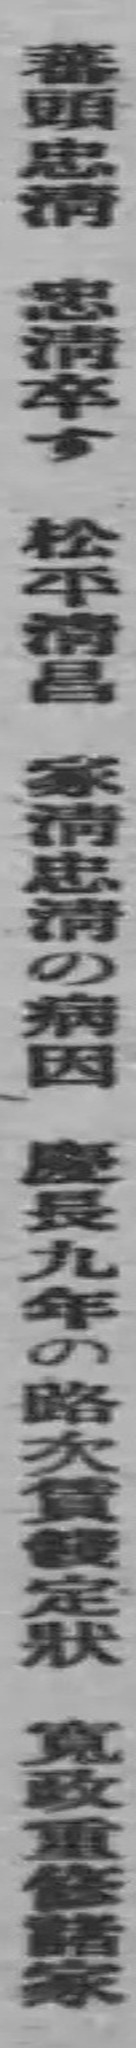蕃頭忠清忠清卒す松平清昌家清忠清の病因慶長九年の路次賃銭定状寛政重修諸家
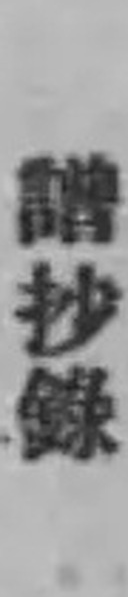譜抄録
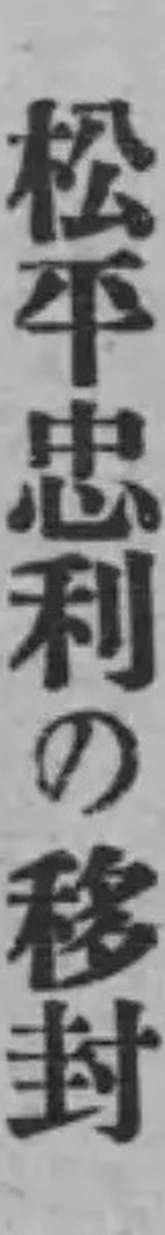松平忠利の移封
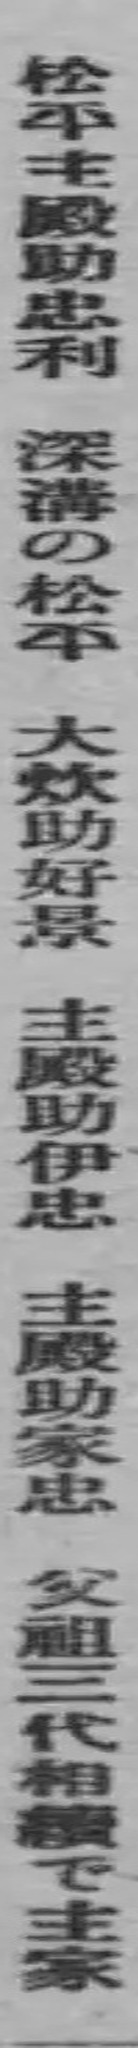松平主殿助忠利深溝の松平大炊助好景主殿助伊忠主殿助家忠父祖三代相続で主家
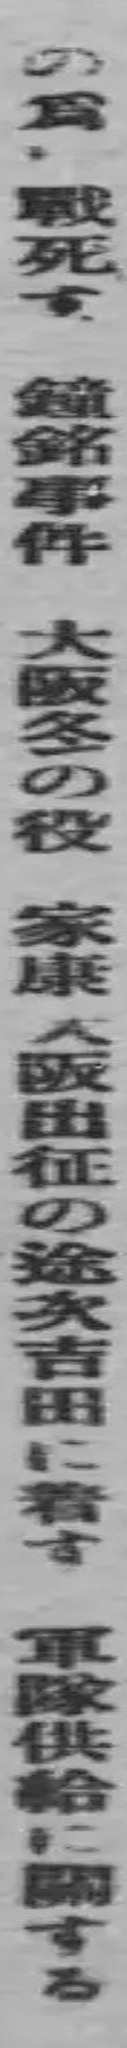の為に戦死す鐘銘事件大阪冬の役家康大阪出征の途次吉田に着す軍隊供給に関する
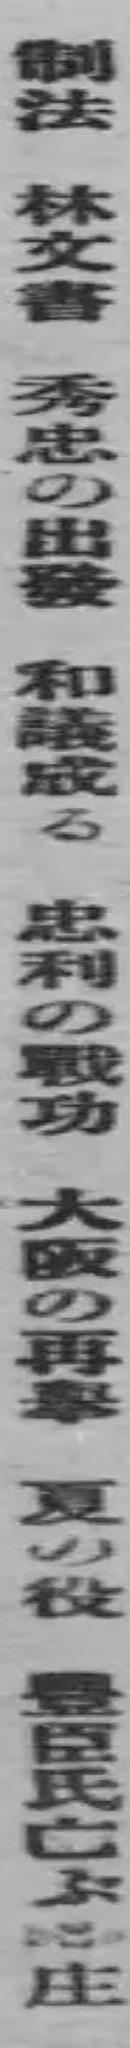制法林文書秀忠の出発和議成る忠利の戦功大阪の再挙夏の役豊臣氏亡ぶ庄
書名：豊橋市史談
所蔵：国立国会図書館 National Diet Library, JAPAN
